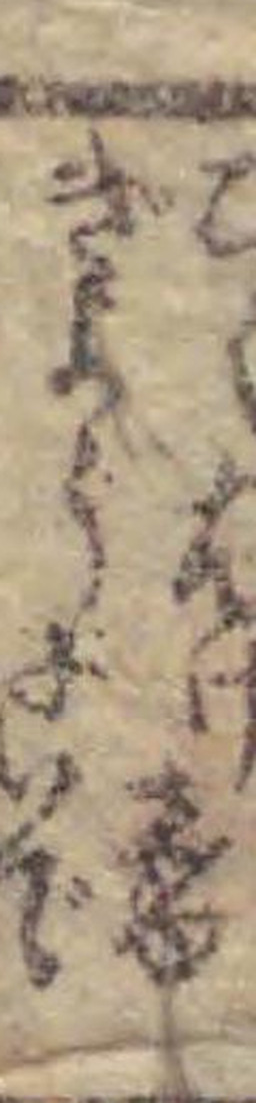ぎようにいで
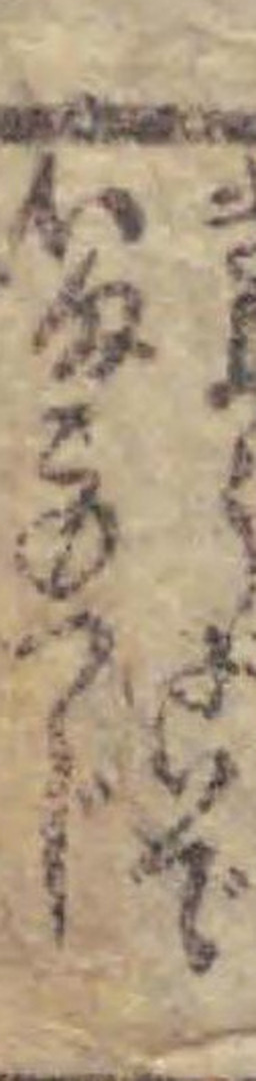いまこのつじ
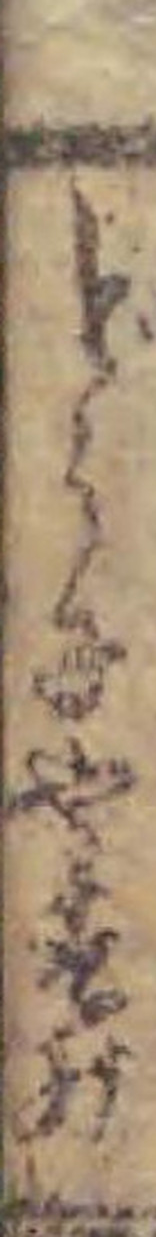どうにやすみ
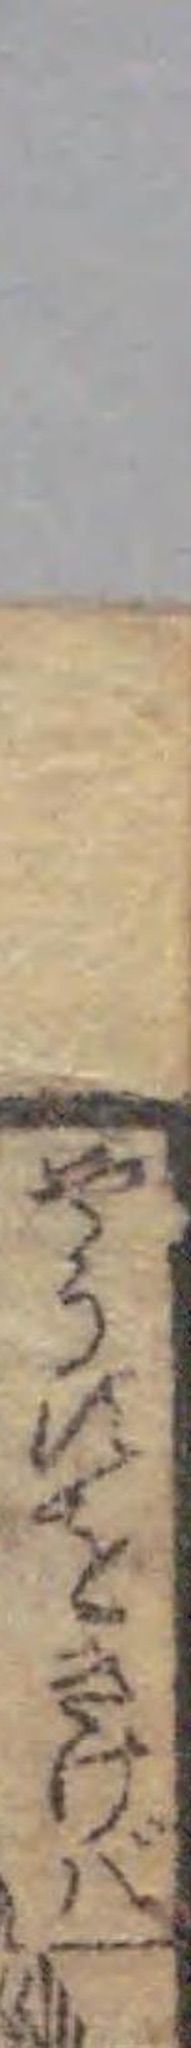やうすをきけば
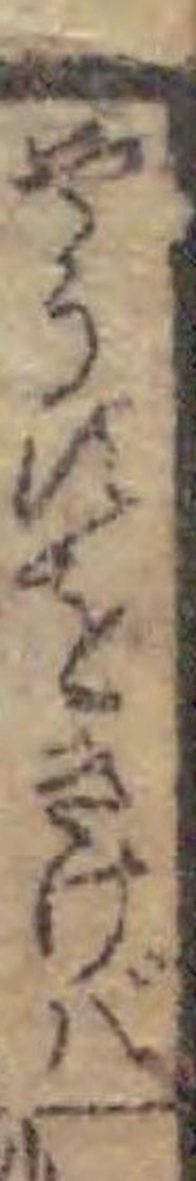やうすをきけば
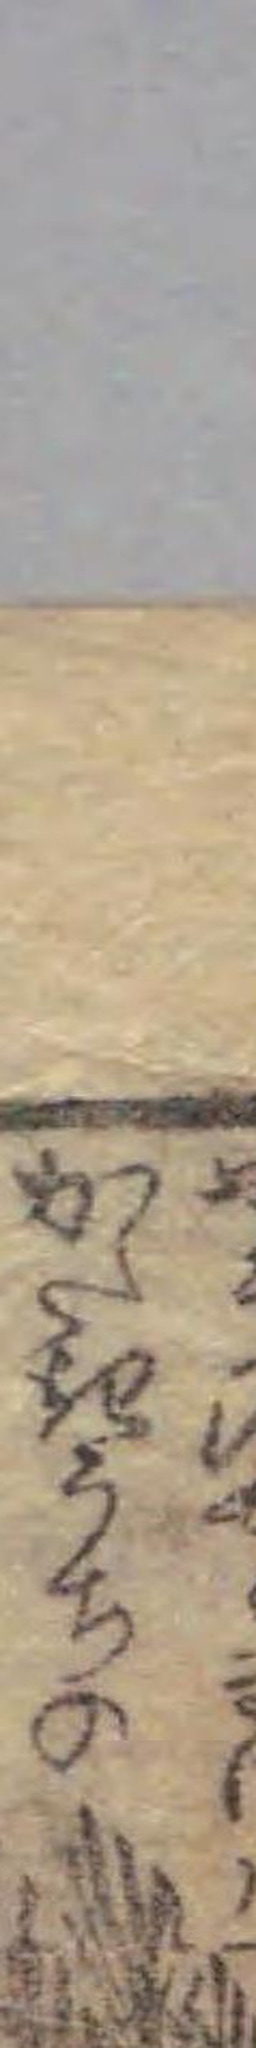かたきうちの
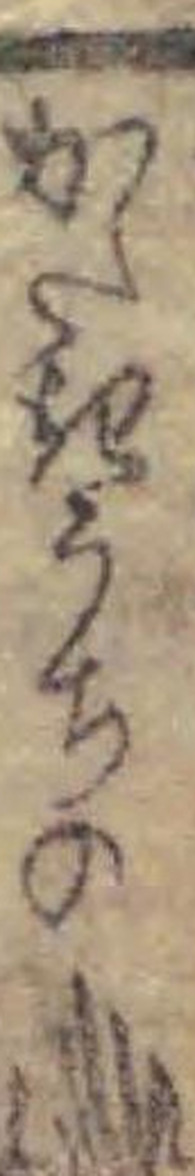かたきうちの
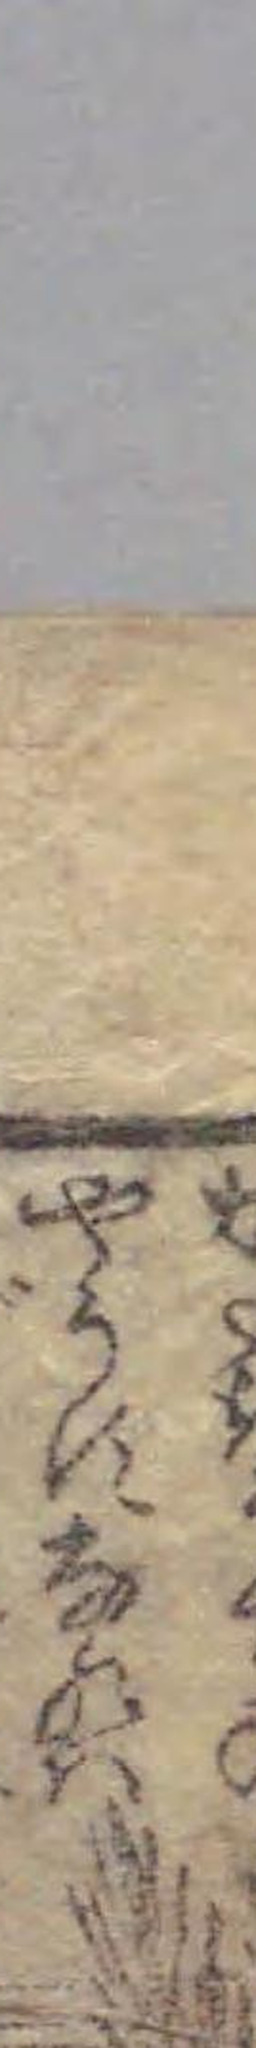やうすなれは
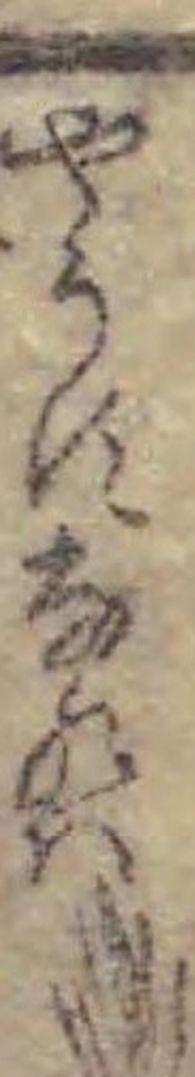やうすなれは
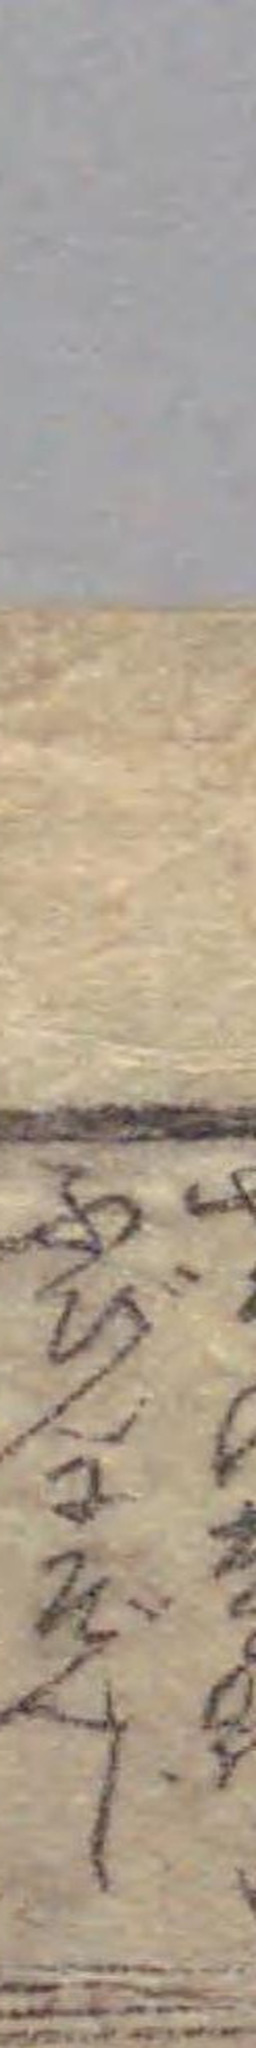ふびんにぞんし
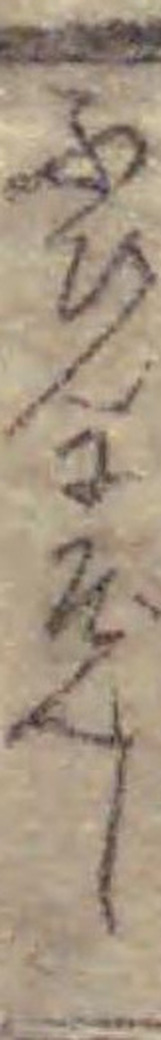ふびんにぞんし
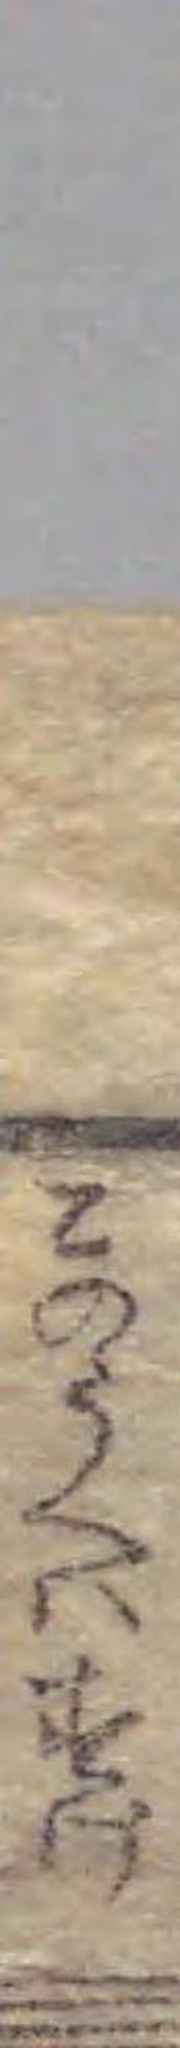このうへはすけ
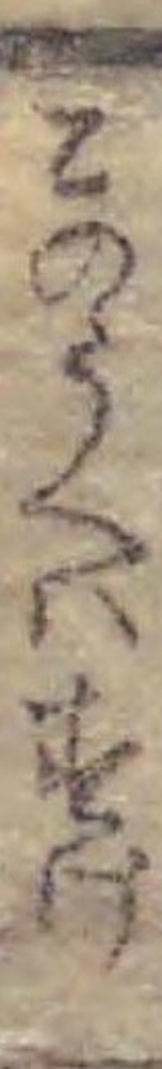このうへはすけ
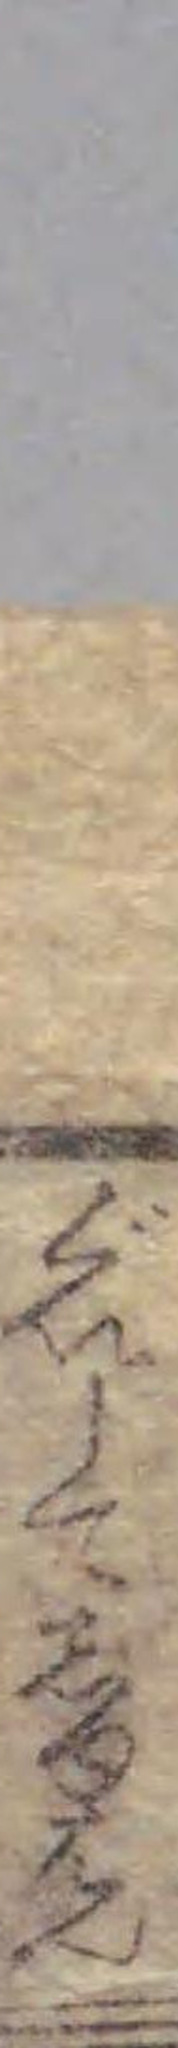ぐいしてしゆはん
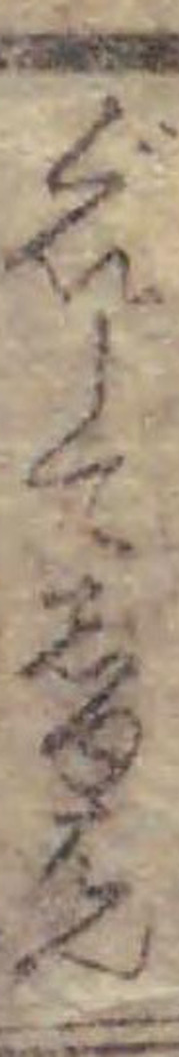ぐいしてしゆはん
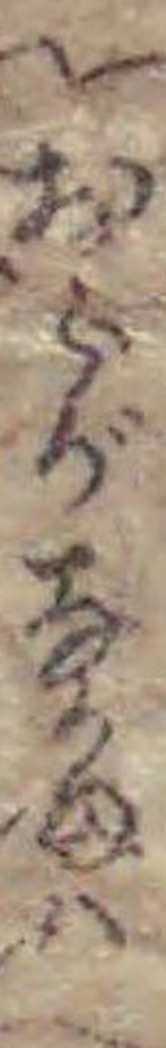〽おらがなかまは
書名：化物世界夜半嵐 : 3巻
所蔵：国立国会図書館 National Diet Library, JAPAN
